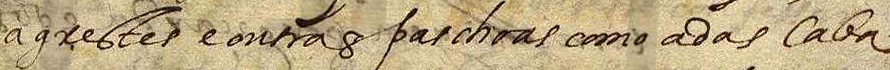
agrestes e outras paschoas como a das caba
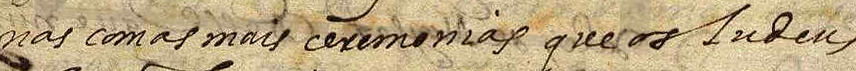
nas com as mais çeremonias que os Judeus
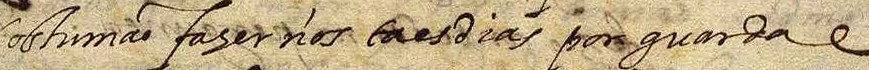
costumão fazer nos taes dias por guarda e
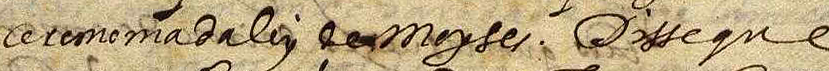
ceremonia da ley de moyses. Disse que
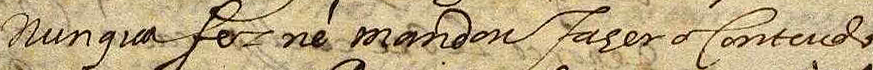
nunqua fez nē mandou fazer o conteudo
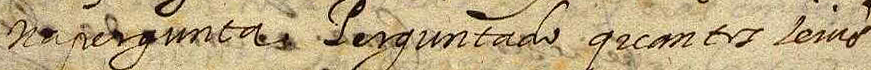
na pergunta. Perguntado quantos ieius̄
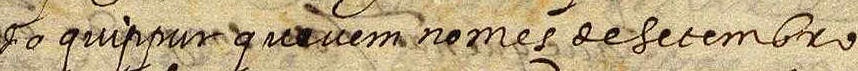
do quippur que vem no mes de setembro
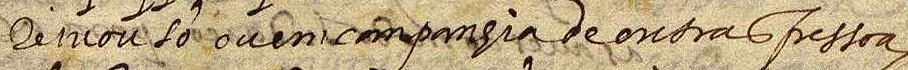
ieiuou só ou en companhia de outras pessoas
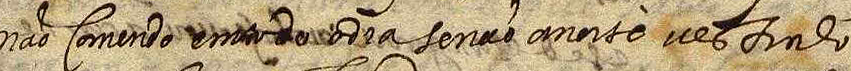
naõ Comendo em todo o dia senaõ a noite vestindo
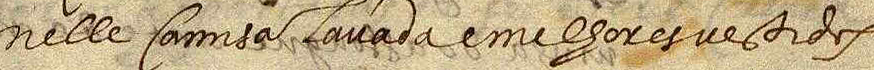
nelle Camisa lavada e melhores vestidos
